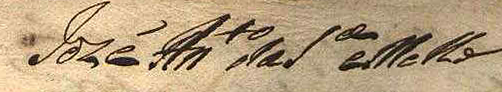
Iozé An.to da S.a e Mello
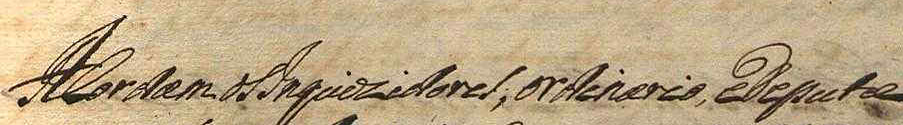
ACordam os Inquizidores, ordinario, e Deputa
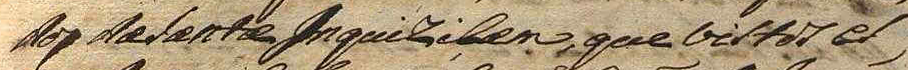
dos da santa JnquiziÇam, que vistos es
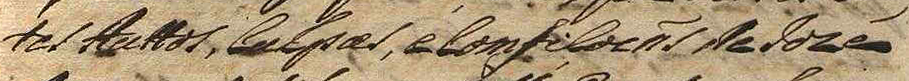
tes Auttos, Culpas, e ComfiÇoen̄s de Iozé
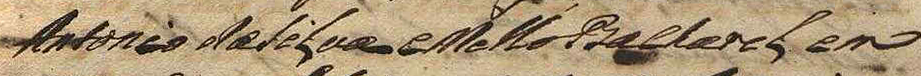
Antonio da Silva e Mello Bacharel em
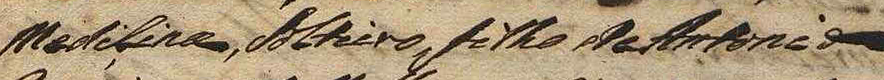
MediÇina, solteiro, filho de Antonio
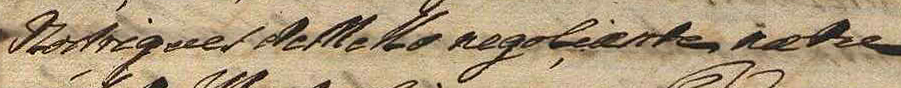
Rodrigues de Mello negoÇiante natu
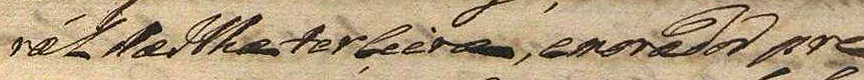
ráL da Ilha terÇeira, e morador pre
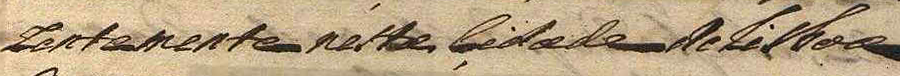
zentemente nesta Çidade de Lisboa
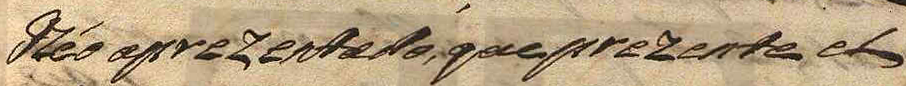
Réo aprezentado, que prezente es
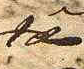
tâ
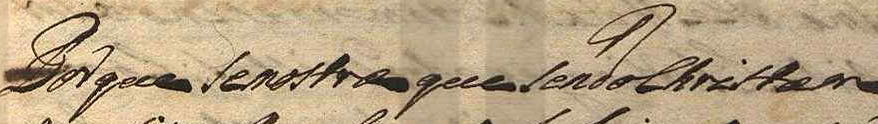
Porque se mostra que sendo Christam
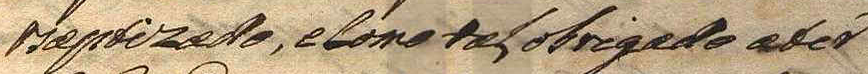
Baptizado, e Como tal, obrigado a ter
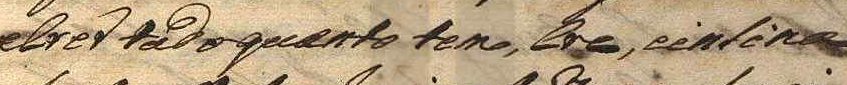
e Crer todo quanto tem, Cre, e insina
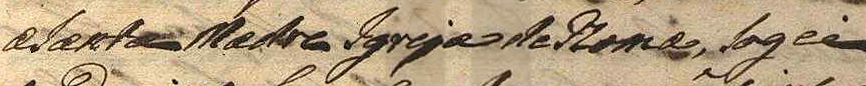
a Santa Madre Igreja de Roma, sogei
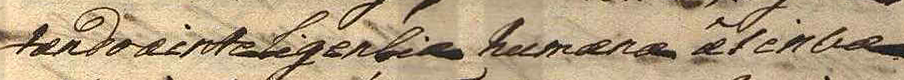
tando a inteLigençia humana âs inva
